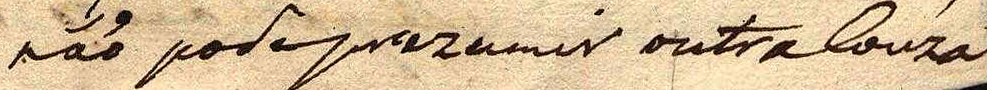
naõ pode prezumir outra Couza
